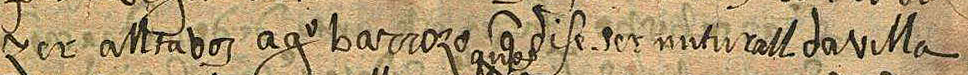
zer allta voz a go barrozo q̄ dise ser naturall da villa
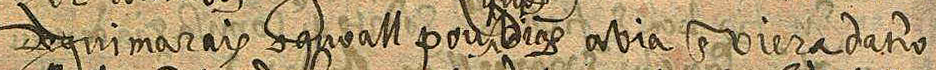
De guimarais o quoall pouquo dias avia q̄ viera da Ro
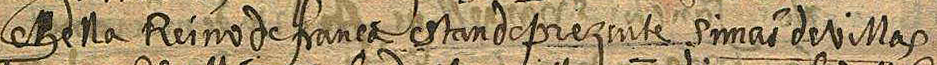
chella Reino de frança estando prezente simaõ de villas
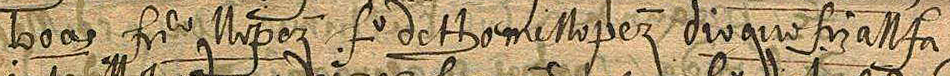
boas frco llopez fo de thome llopez̄ dioguo frz̄ allfa
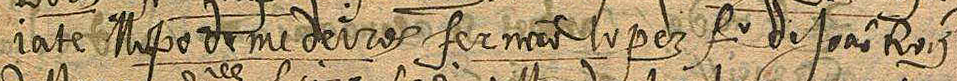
iate llopo de medeiros fernão lopez fo de Joaõ Roiz̄
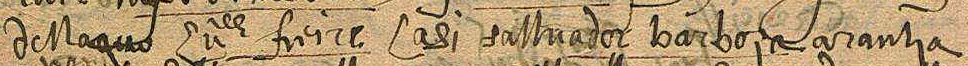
de llaguo E mel freire E asi salluador barboza aranha
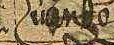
Eu ando
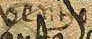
venho
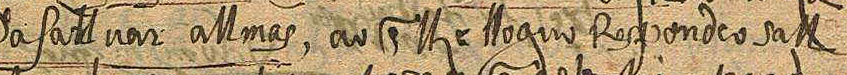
a saluar allmas, ao q̄ lhe lloguo Respondeo sall
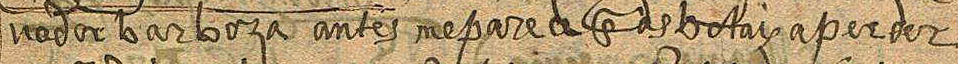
uador barboza antes me pare q̄ as botais a perder
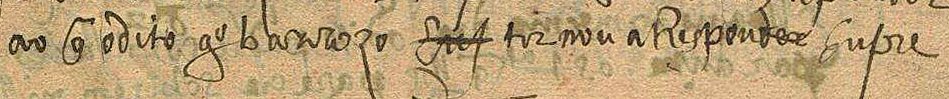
ao q̄ o dito go barrozo Eu/ tornou a Responder Eu pre
